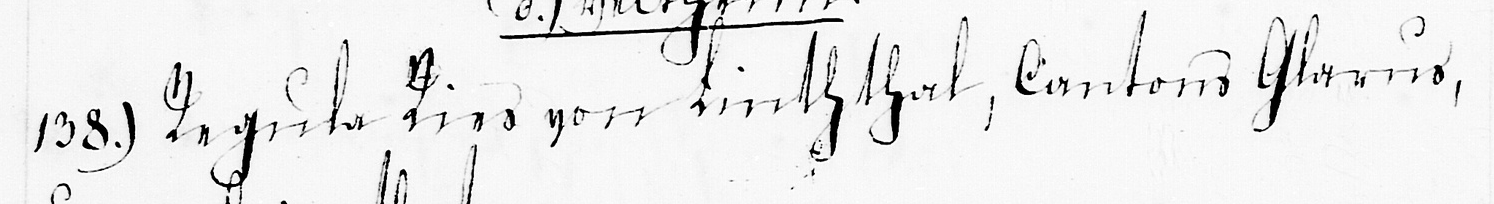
138.) Regula Ries von Linththal, Cantons Glarus,
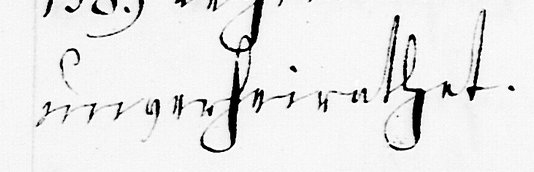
unverheirathet.
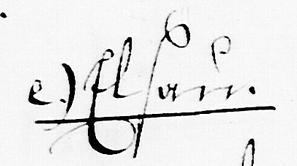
e.) Elsau.
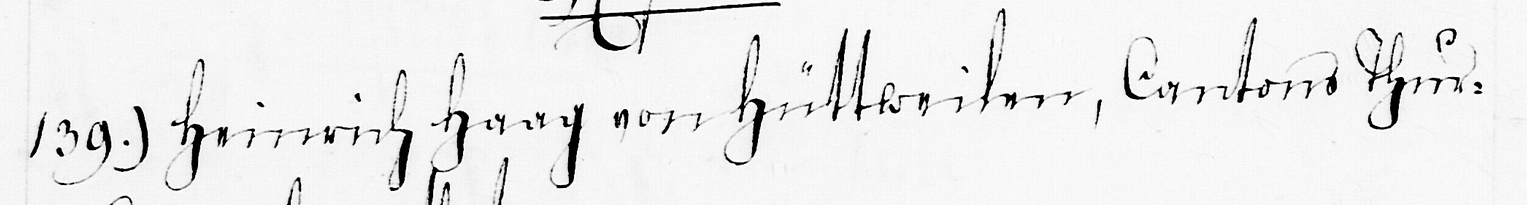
139.) Heinrich Haag von Hüttweilen, Cantons Thur¬
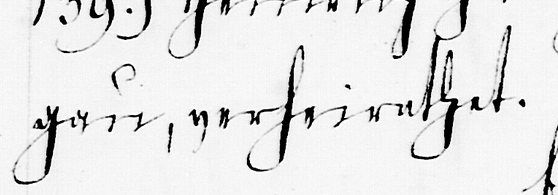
gau, verheirathet.
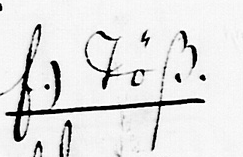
f.) Töß.
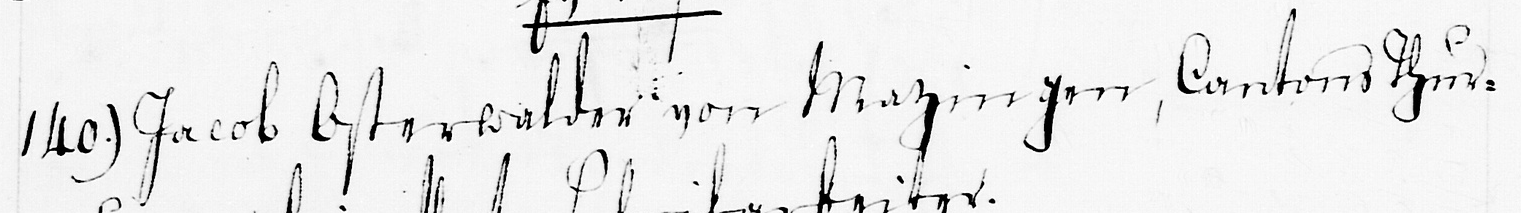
140.) Jacob Osterwalder von Mazingen, Cantons Thur¬
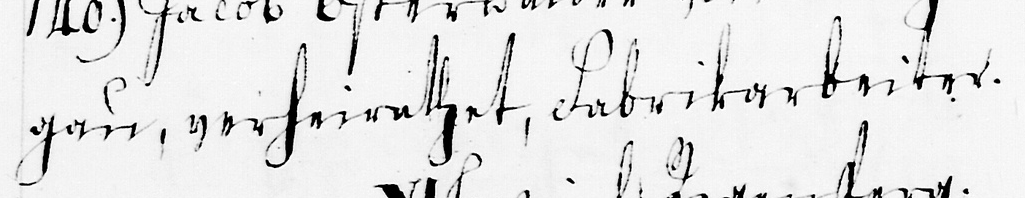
gau, verheirathet, Fabrikarbeiter.
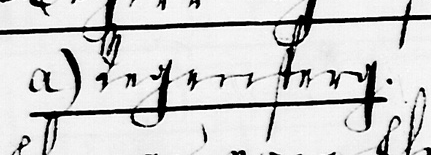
a.) Regensperg.
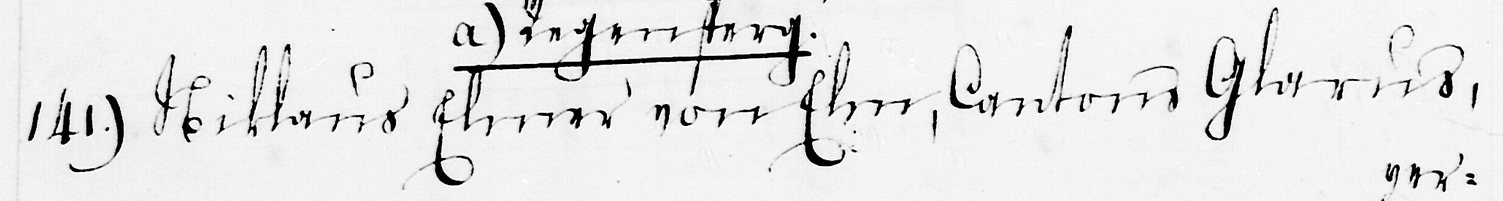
141.) Niklaus Elmer von Elm, Cantons Glarus,
